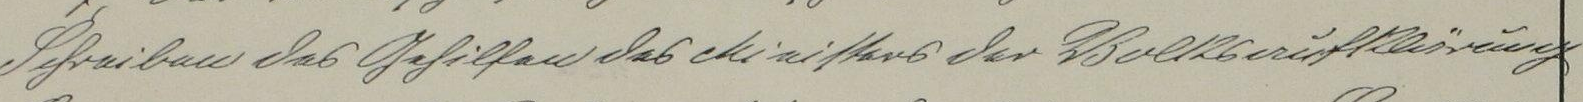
Schreiben des Gehilfen des Ministers der Volksaufklärung
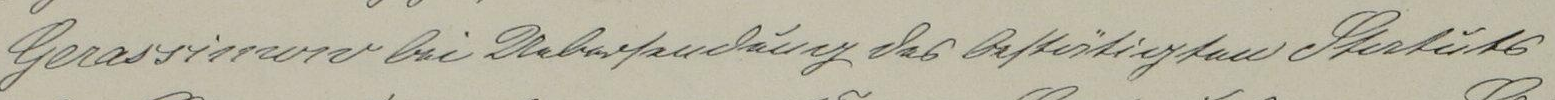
Gerassimow bei Uebersendung des bestätigten Statuts
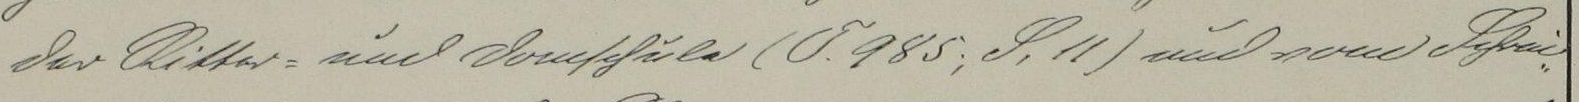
der Ritter- und Domschule (T.985; S.11) und vom Schrei-
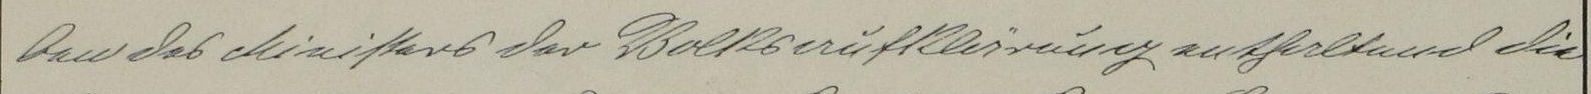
ben des Ministers der Volksaufklärung enthaltend die
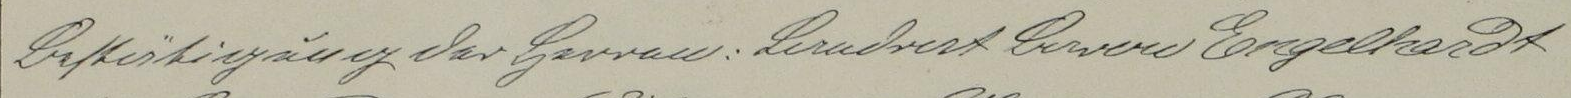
Bestätigung der Herren: Landrat Baron Engelhardt
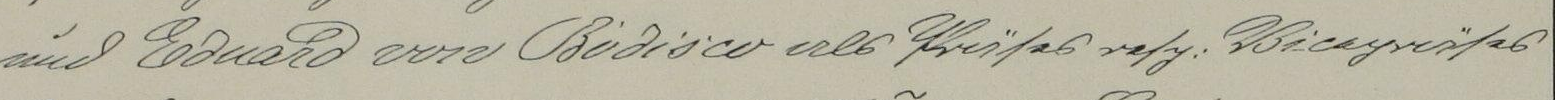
und Eduard von Bodisco als Präses resp. Vicepräses
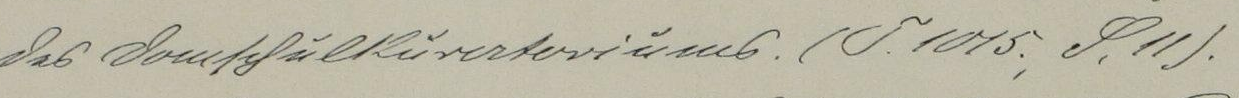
des Domschulkuratoriums (T.1015; S.11).
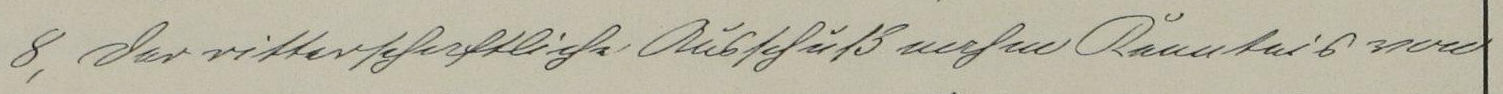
8. Der ritterschaftliche Ausschuß nahm Kenntnis von
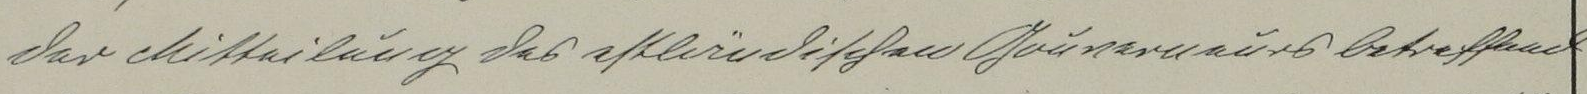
der Mitteilung des estländischen Gouverneurs betreffend
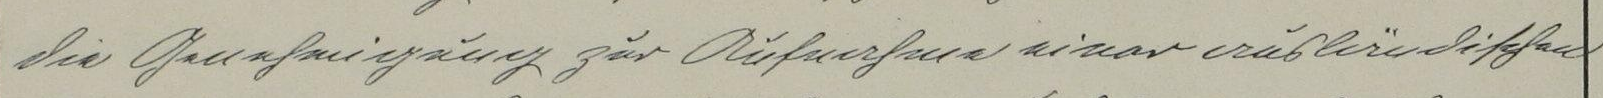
die Genehmigung zur Aufnahme einer ausländischen
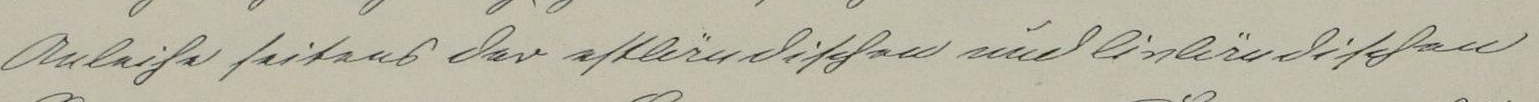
Anleihe seitens der estländischen und livländischen
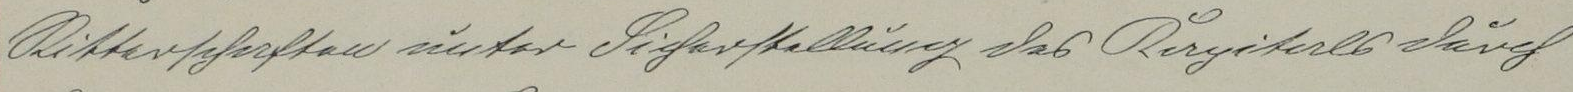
Ritterschaften unter Sicherstellung des Kapitals durch
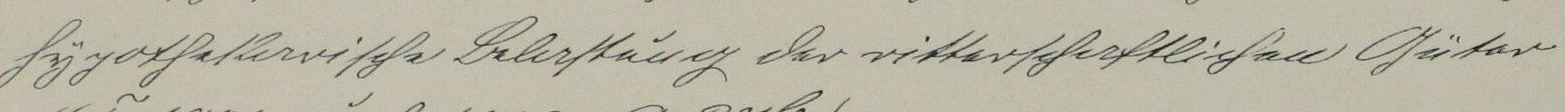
hypothekarische Belastung der ritterschaftlichen Güter
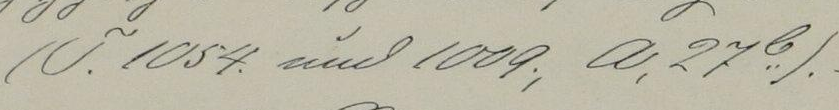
(T.1054 und 1009; A.27b).
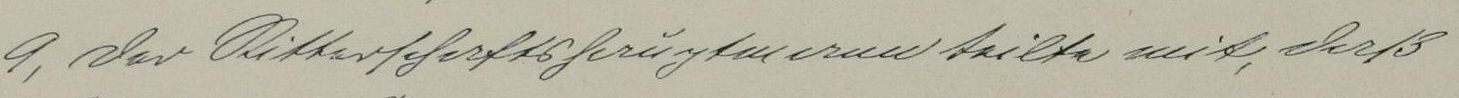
9. Der Ritterschaftshauptmann teilte mit, daß
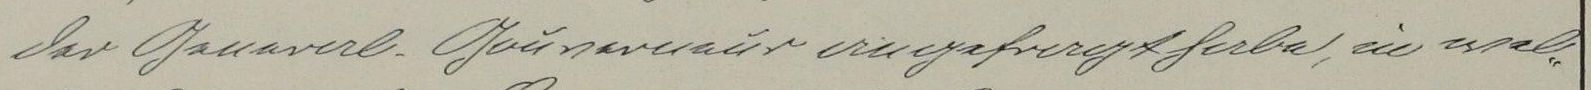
der General-Gouverneur angefragt habe, in wel-
